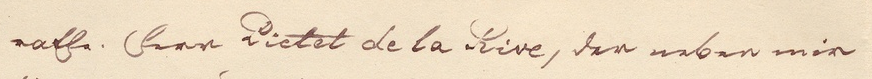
rathe. Herr Pictet de la Rive, der neben mir
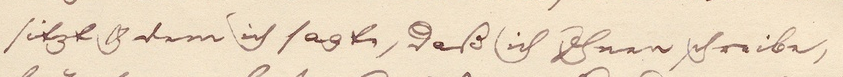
sitzt & dem ich sagte, daß ich Ihnen schreibe,
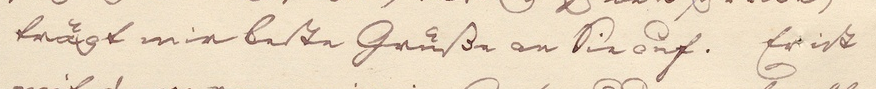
trägt mir beste Grüße an Sie auf. Er ist
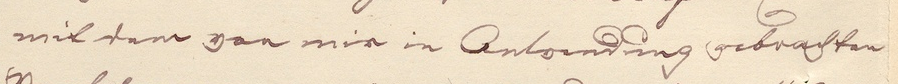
mit dem von mir in Anwendung gebrachten
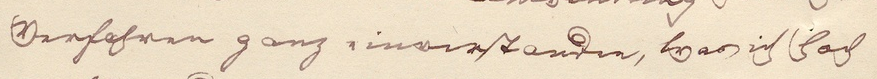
Verfahren ganz einverstanden, was ich hoch
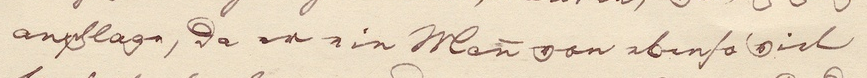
anschlage, da er ein Mann von ebenso viel
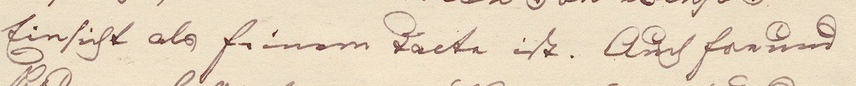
Einsicht als feinem Tacte ist. Auch Freund
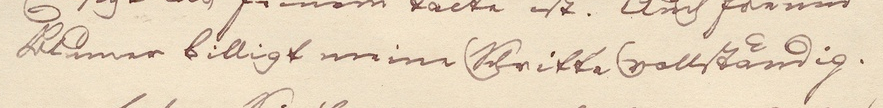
Blumer billigt meine Schritte vollständig.
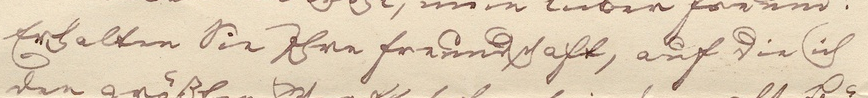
Erhalten Sie Ihre Freundschaft, auf die ich
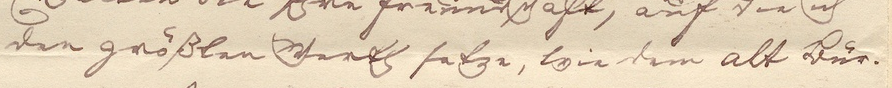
den größten Werth setze, wie dem alt Bür-
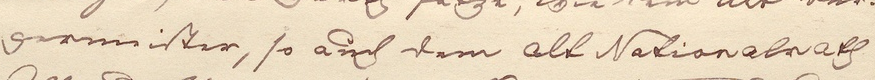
germeister, so auch dem alt Nationalrath
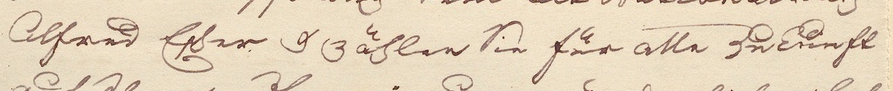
Alfred Escher & zählen Sie für alle Zukunft
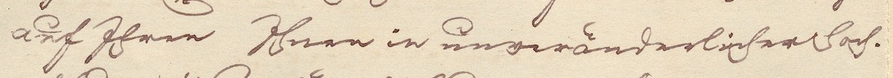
auf Ihren Ihnen in unveränderlicher Hoch-
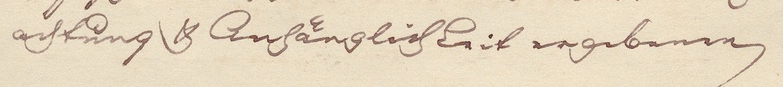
achtung & Anhänglichkeit ergebenen
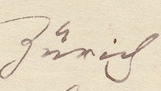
Zürich
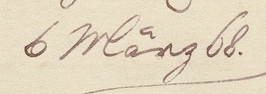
6 März 68.
